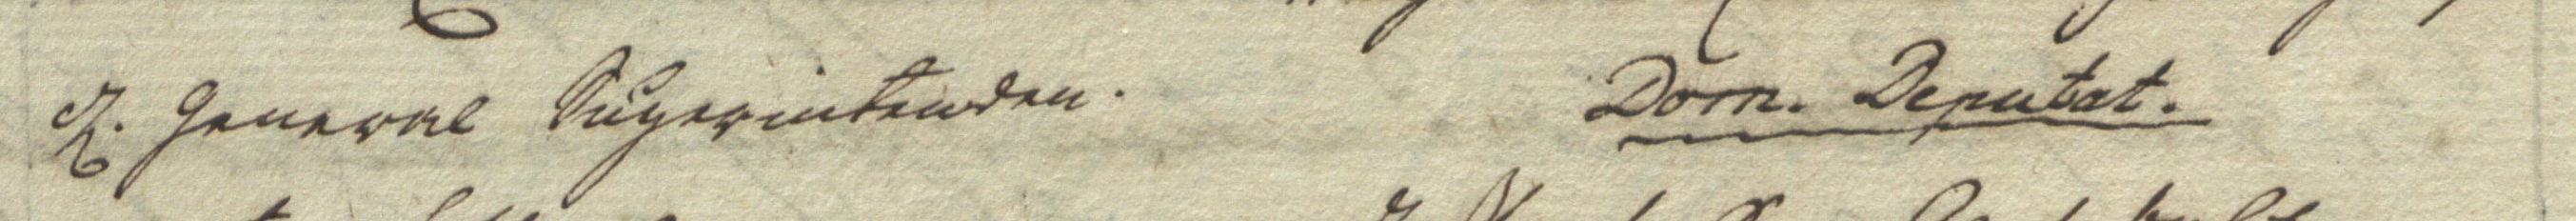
dh. General Superintenden¬ Dom. Deputat.
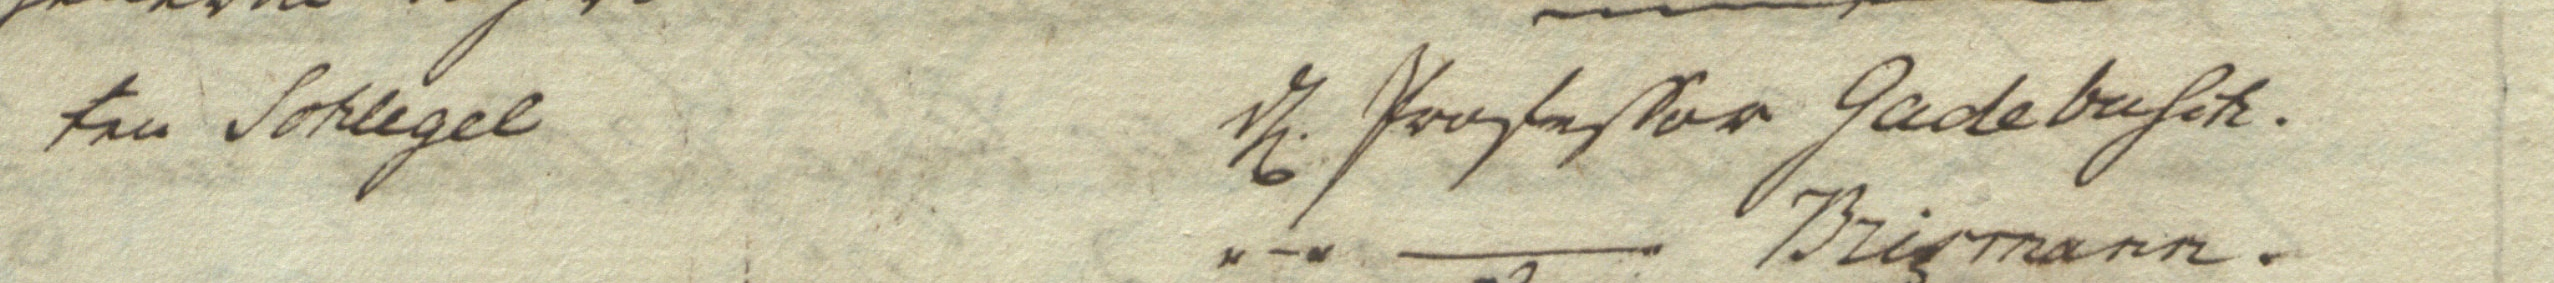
ten Schegel dh. Professor Gadebusch.
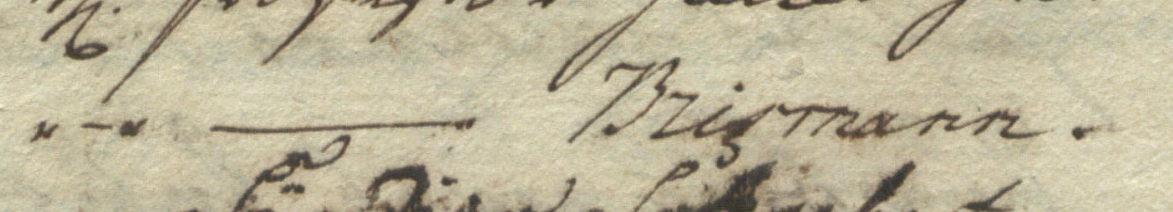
Brismann.
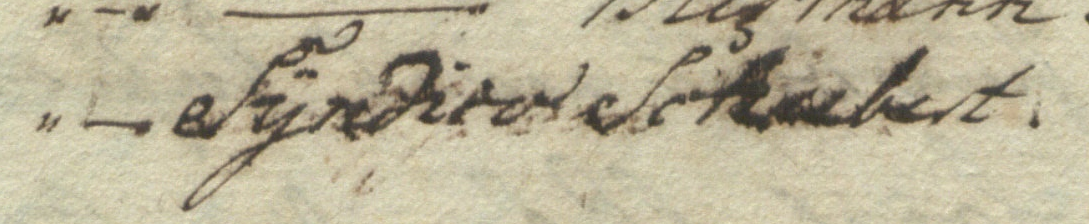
Sÿndico Schubert.
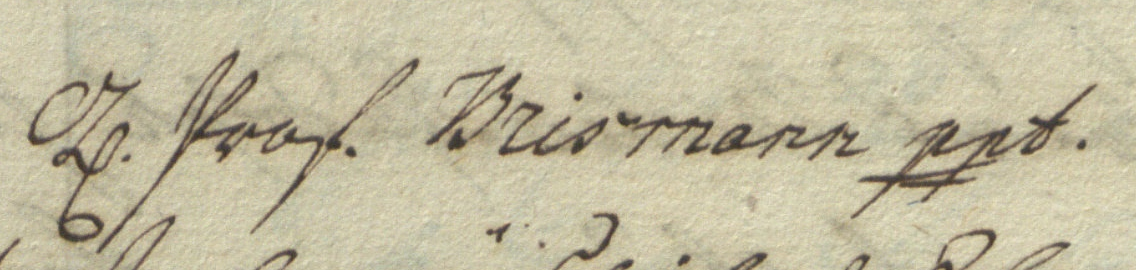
dh. Prof. Brismann ppt.
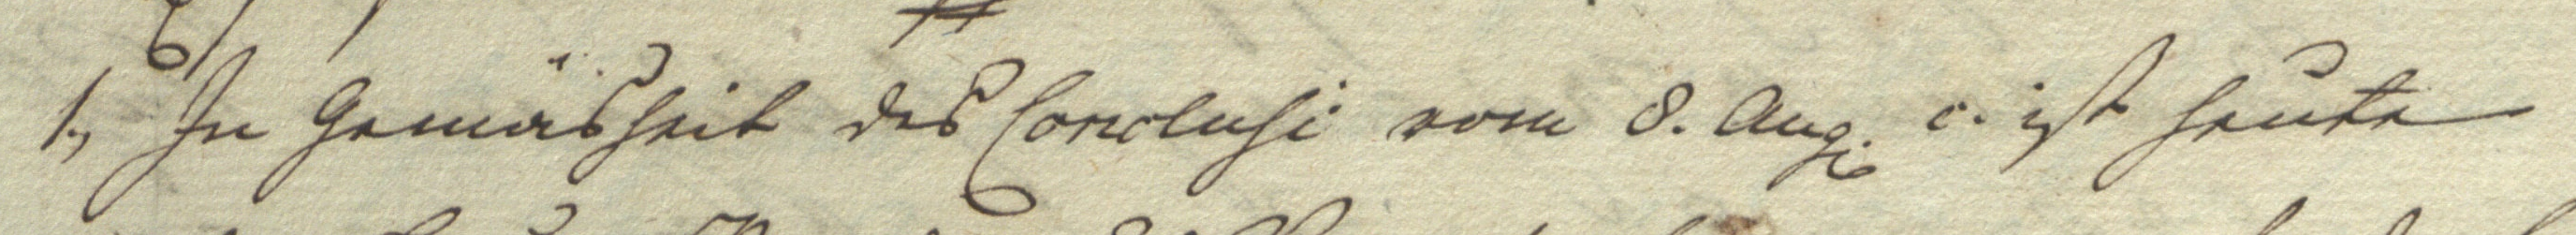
1., In Gemäsheit des Conclusi vom 8. Aug. c. ist heute
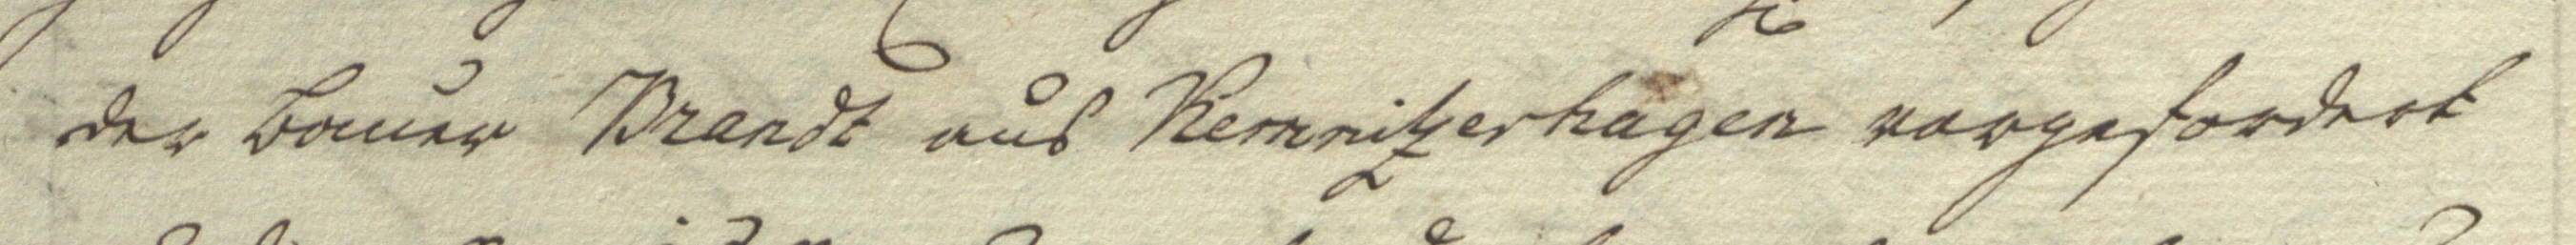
der Bauer Brandt aus Kemnitzerhagen vorgefordert
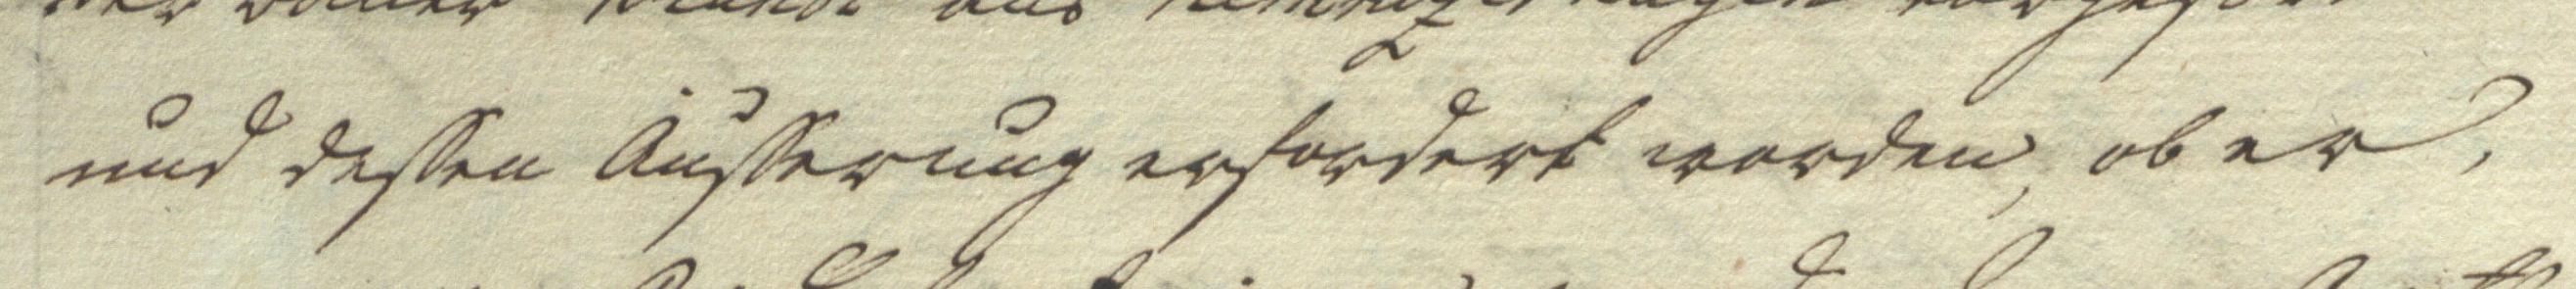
und dessen Äusserung erfordert worden, ob er
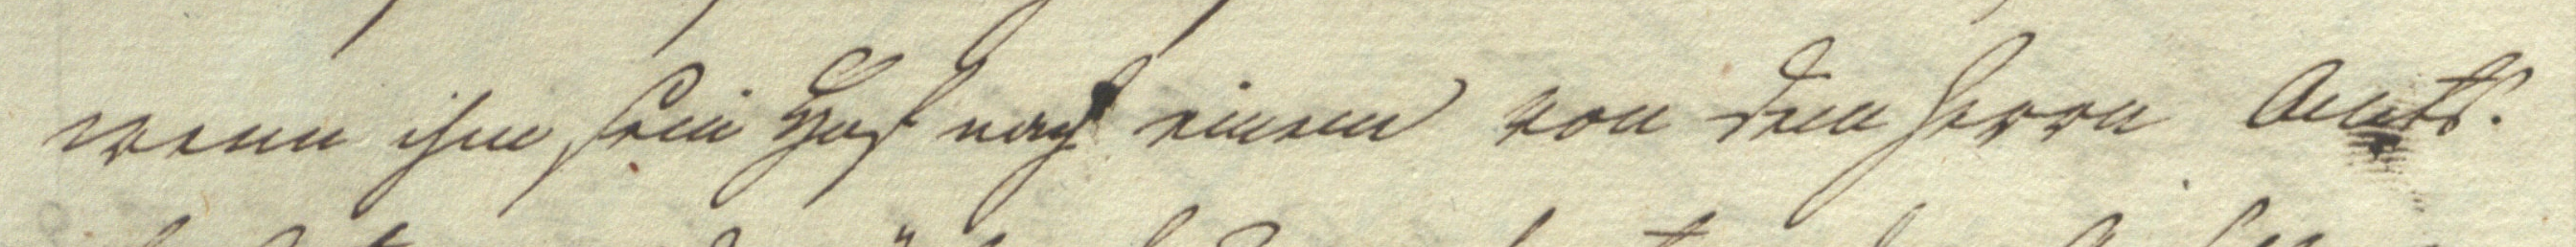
wenn ihm sein Hof nach einem von dem Herrn Amts¬
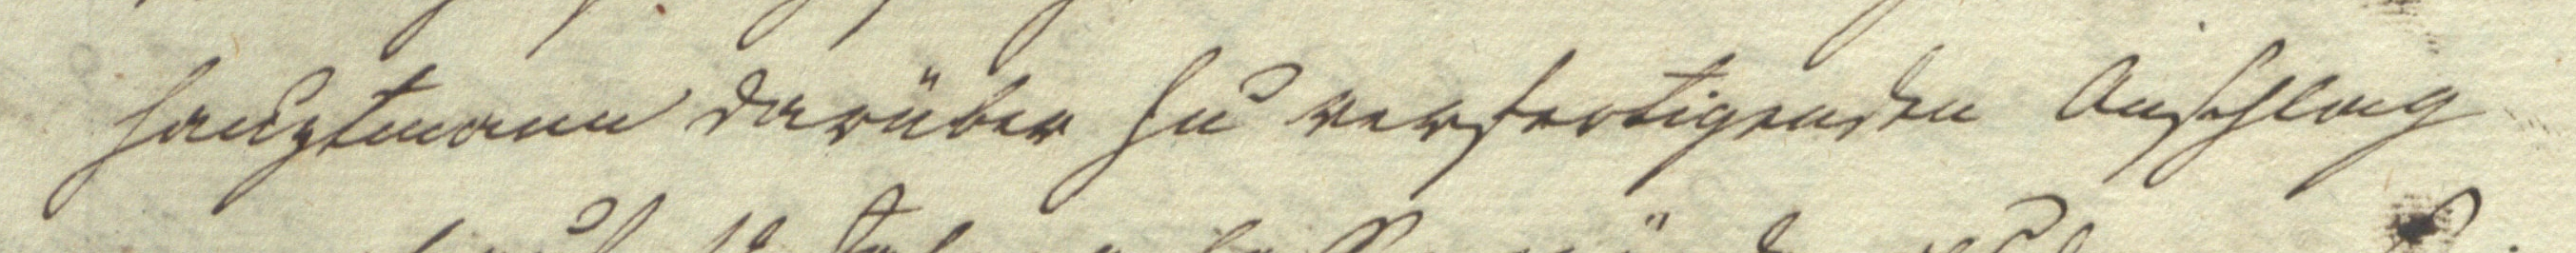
hauptmann darüber zu verfertigenden Anschlag
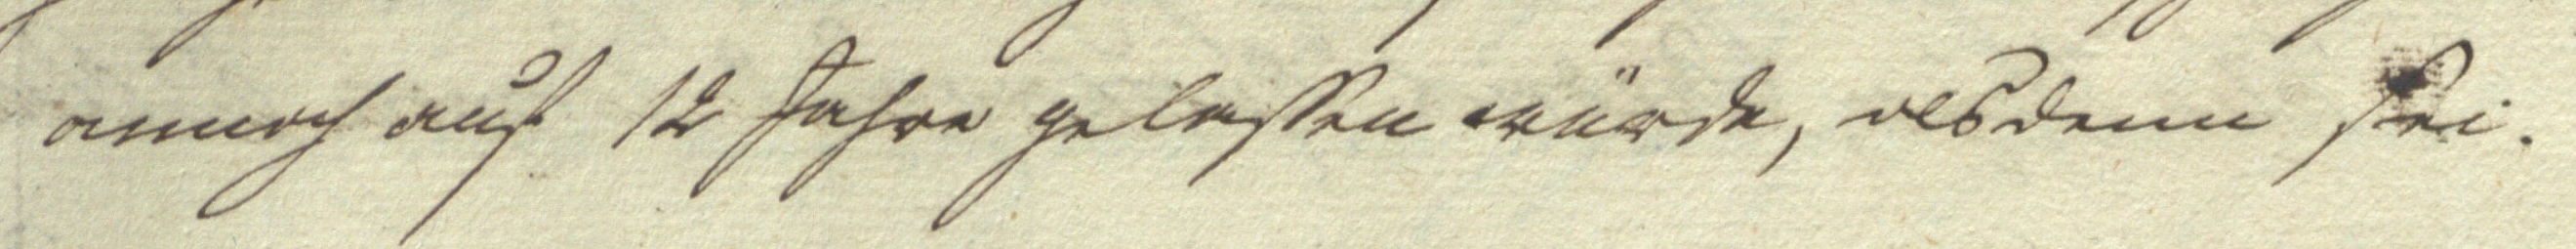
annoch auf 12 Jahre gelassen würde, alsdenn sei¬
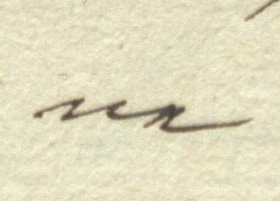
ne
